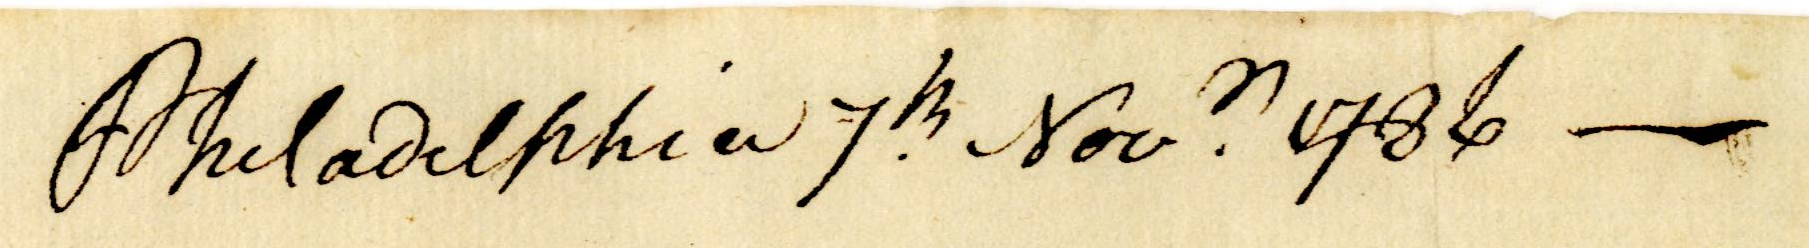Philadelphia 7^th. Nov^r. 1786-
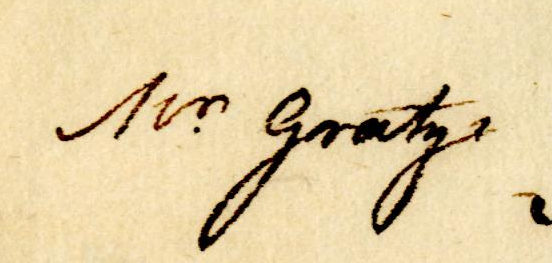M^r. Gratz
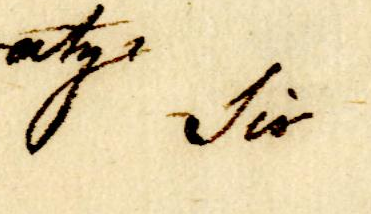Sir
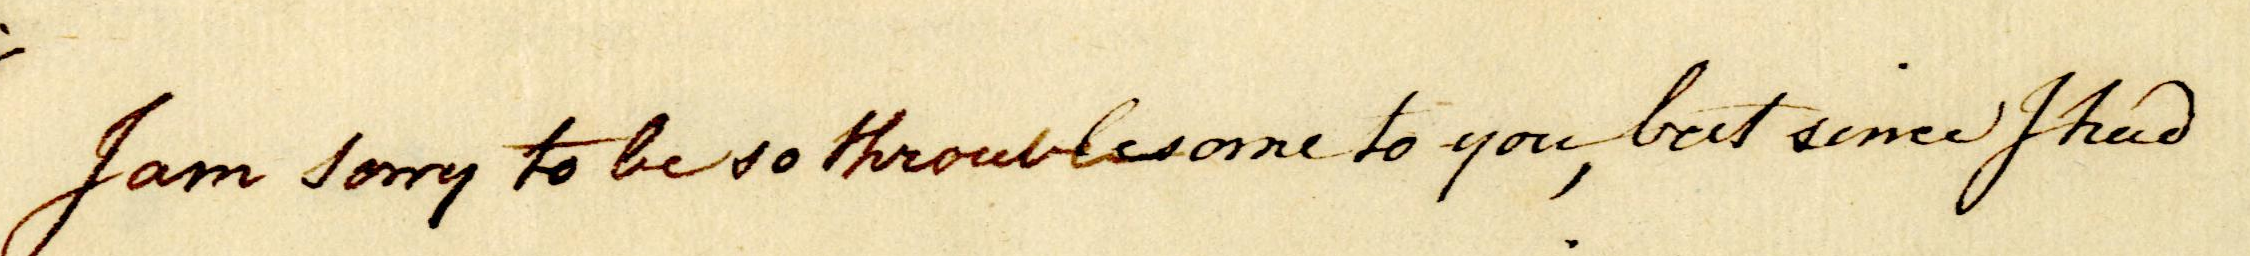I am sorry to be so throublesome to you, but since I had
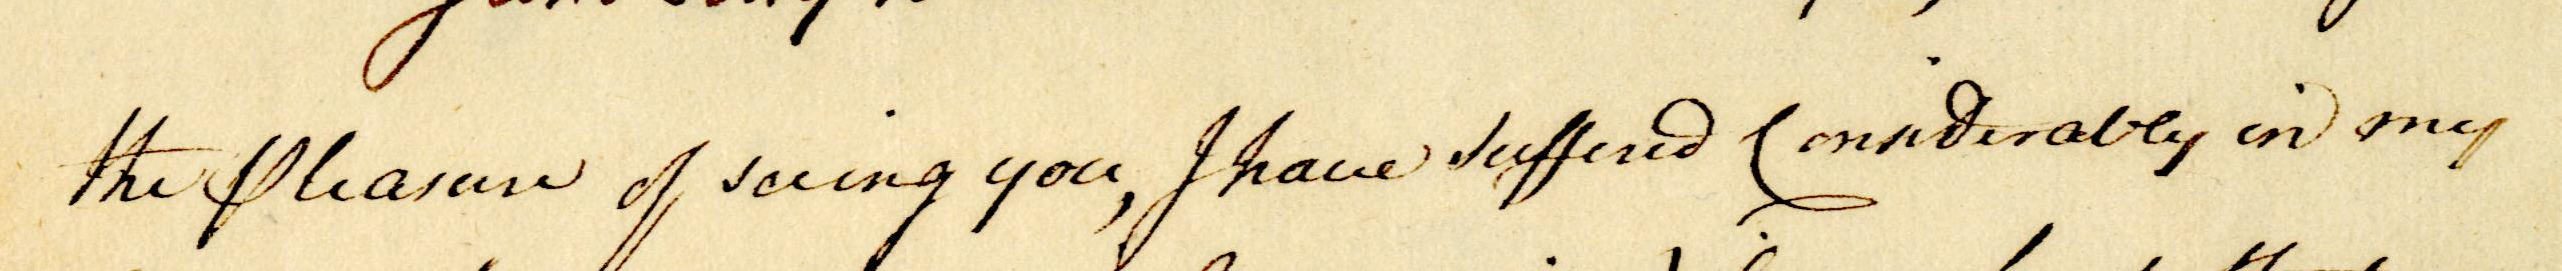the Pleasure of seeing you I have suffered Considerably in my
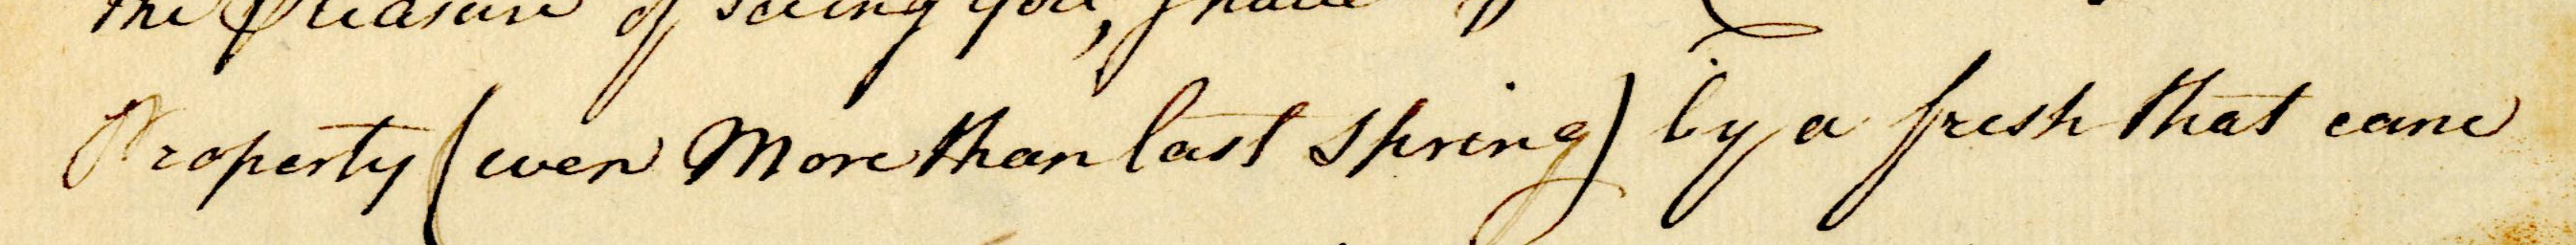Property (even More than last spring) by a frost that came
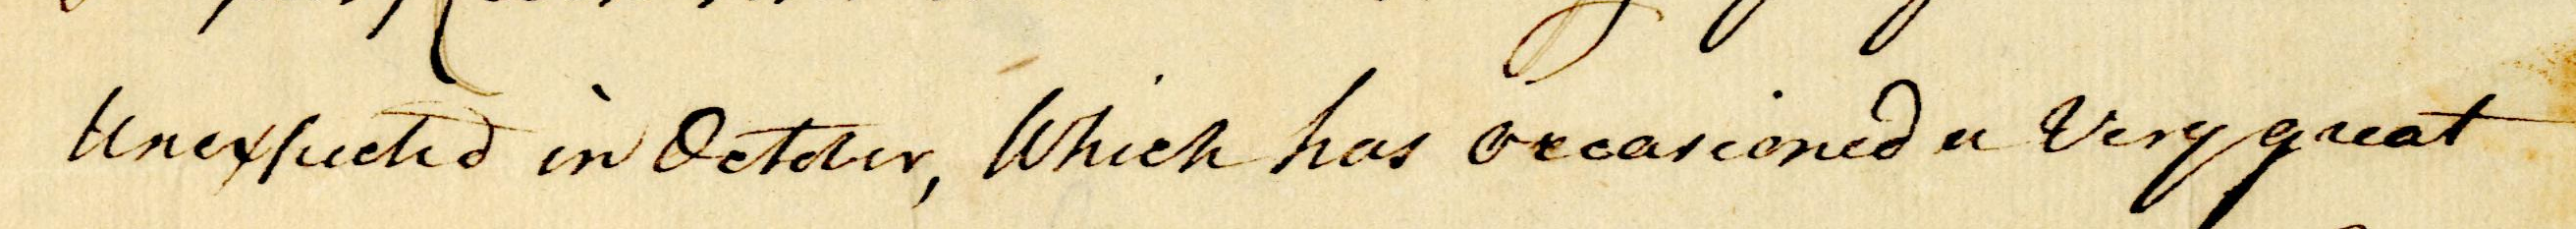unexpected in October, Which has occasioned a Very great
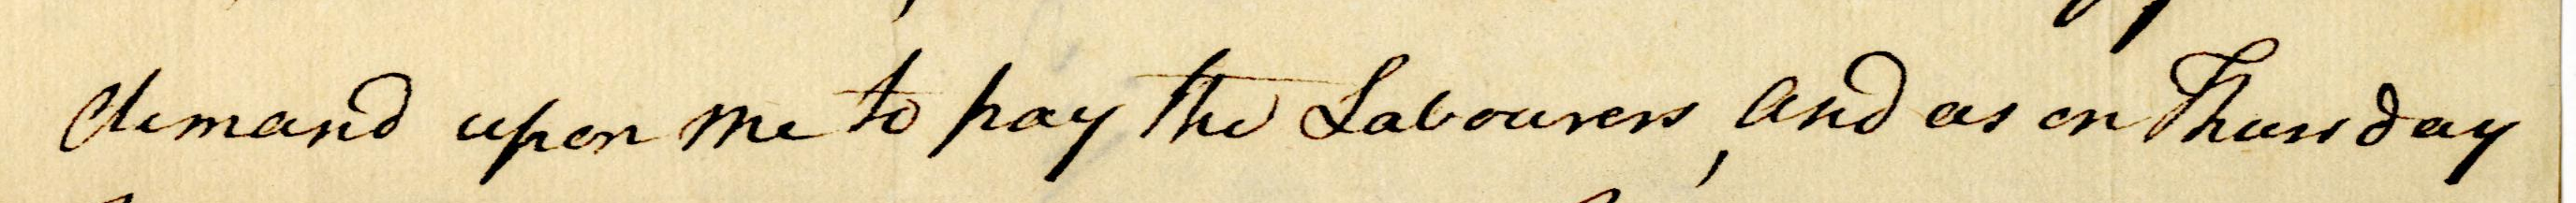Demand upon me to pay the Labourers and as on thursday
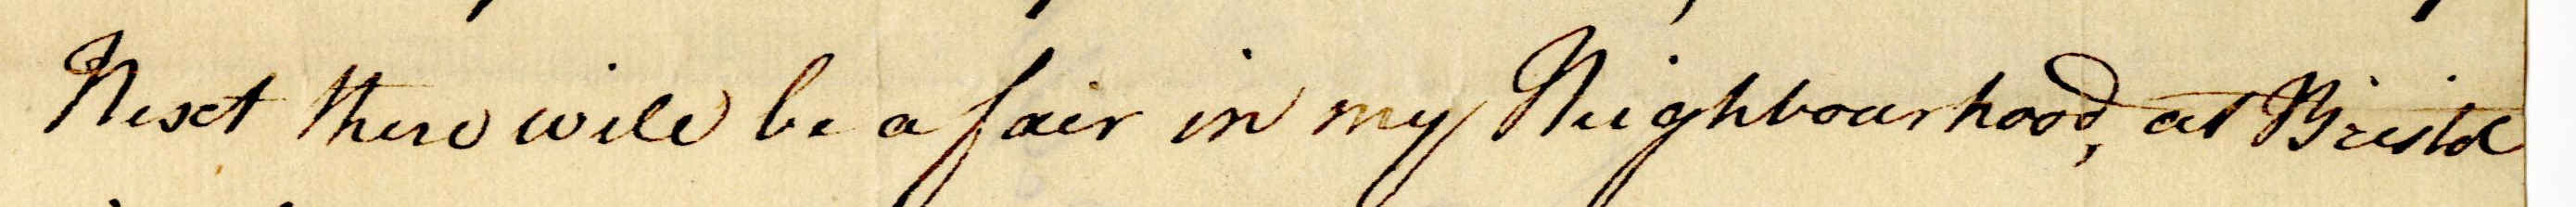Next there will be a fair in my Neighborhood at Bristol
